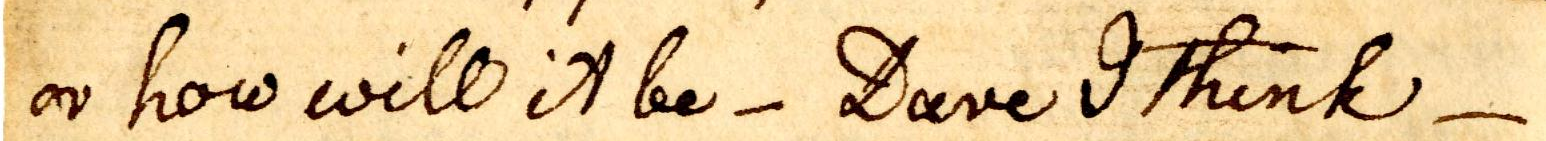or how will it be- Dare I think-
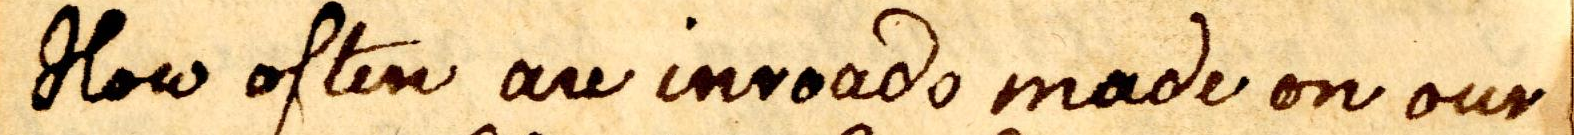How often are inroads made on our
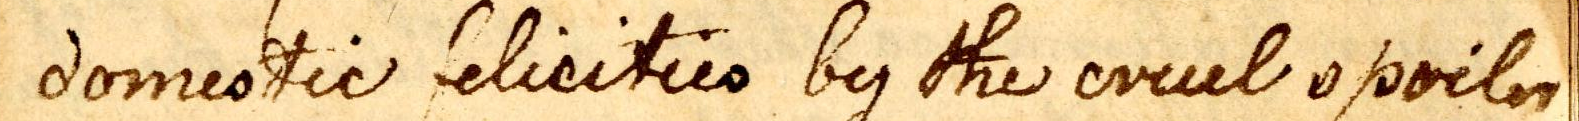domestic felicities by the cruel spoiler
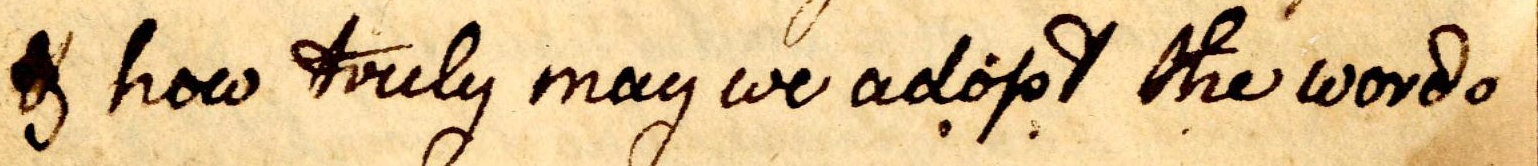& how truly may we adopt the words
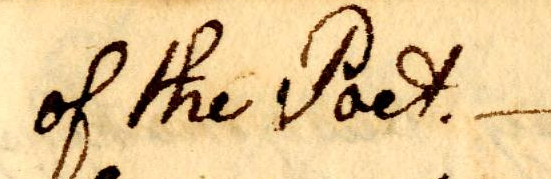of the Poet.-
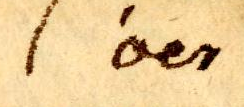('oer
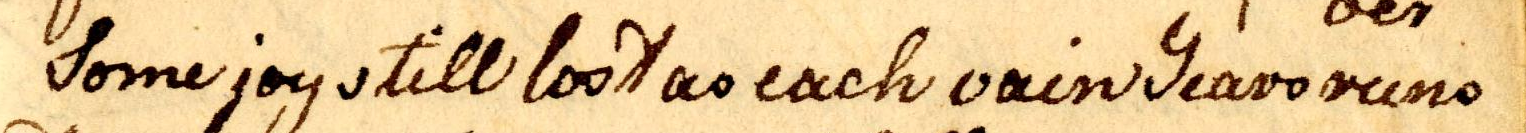Some joy still lost as each vain Years runs
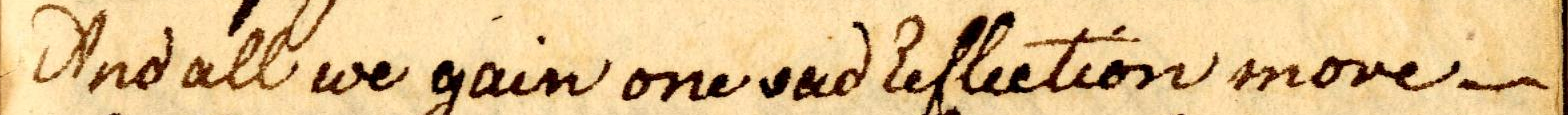And all we gain one sad Reflection more-
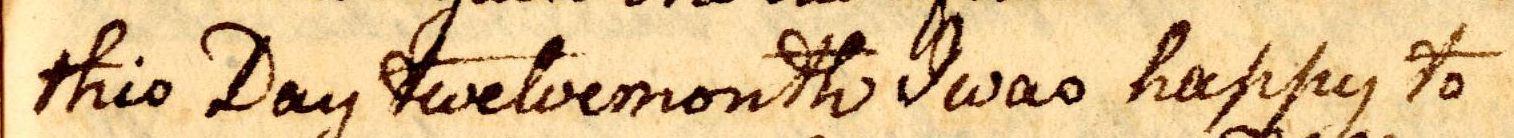this Day twelvemonth I was happy to
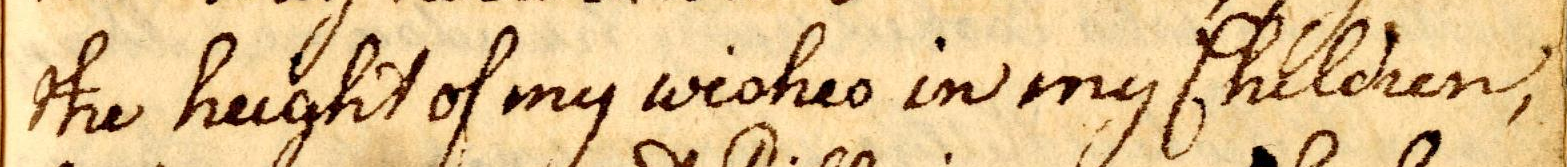the height of my wishes in my Children,
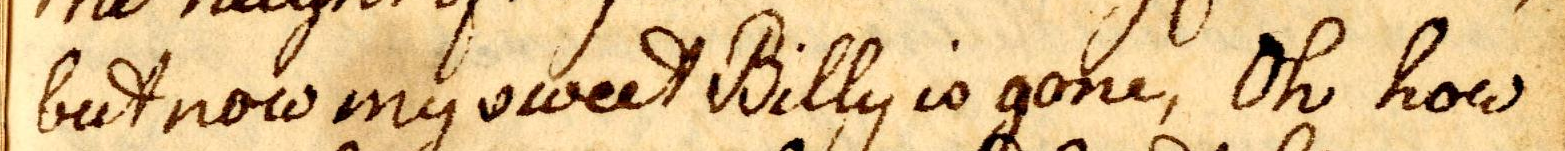but now my sweet Billy is gone, Oh how
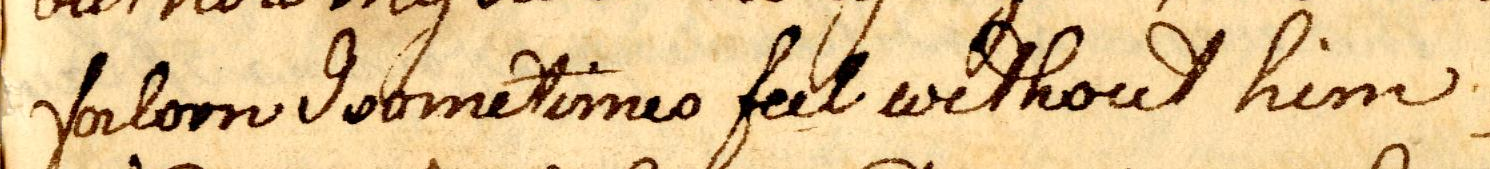forlorn I sometimes feel without him
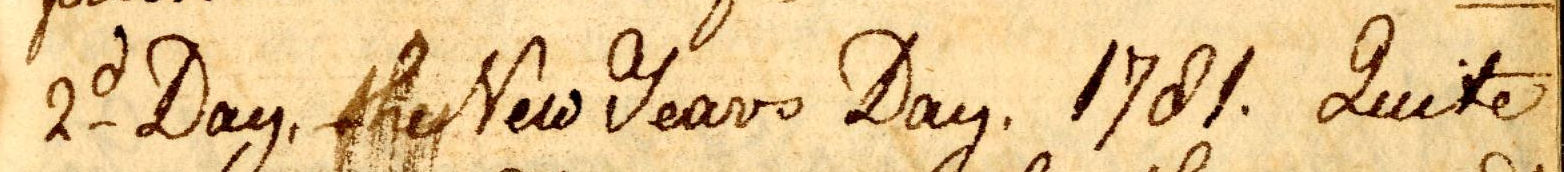2^d Day, the New Years Day, 1781. Quite
